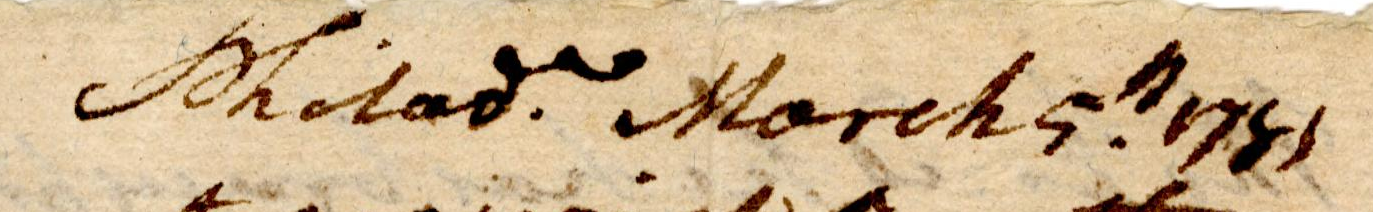Philad^a. March 5^h. 1781
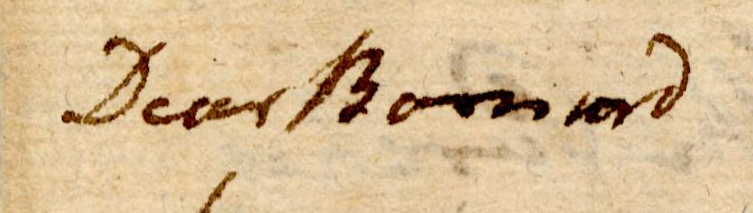Dear Barnard
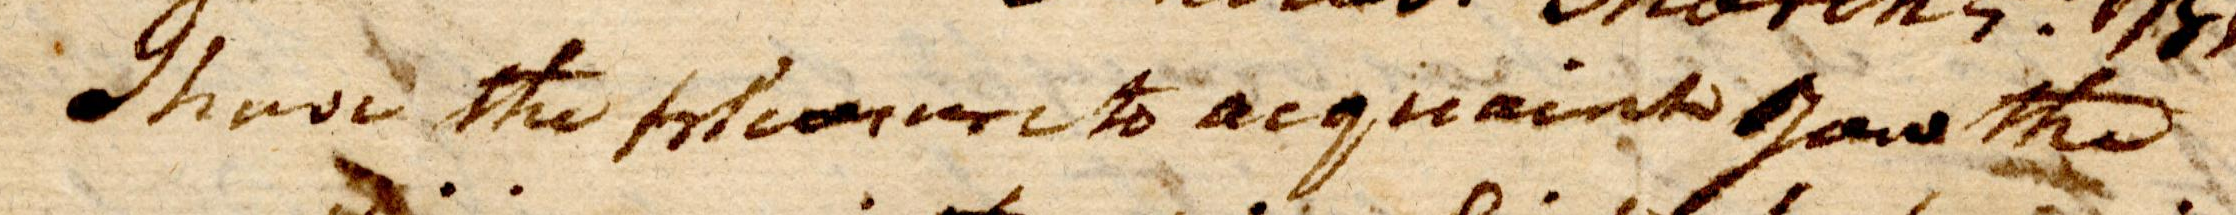I have the pleasure to acquaint you the
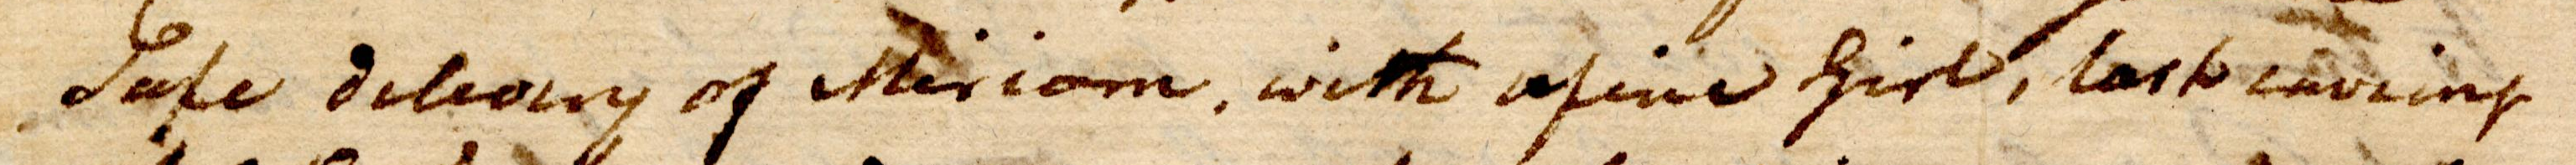safe delivery of Miriam, with a fine Girl, last having
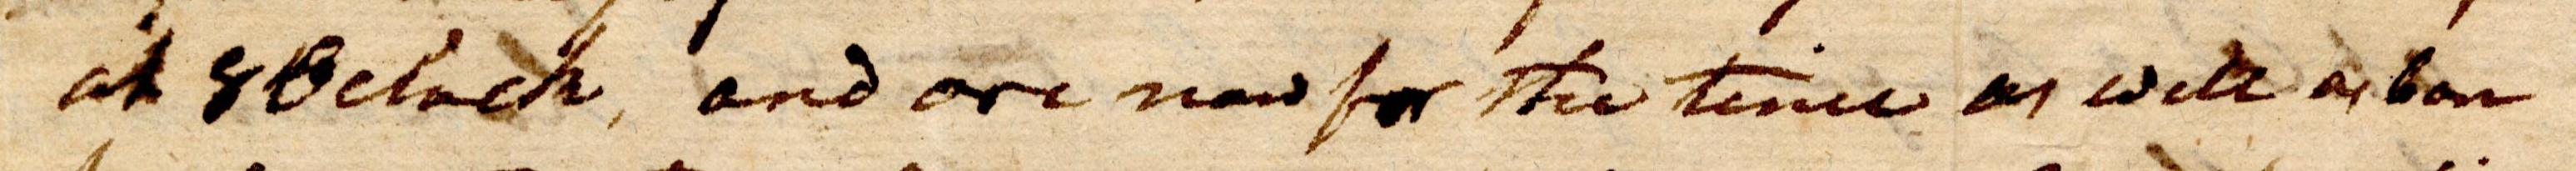at 8 Oclock, and are now for the time as well as can
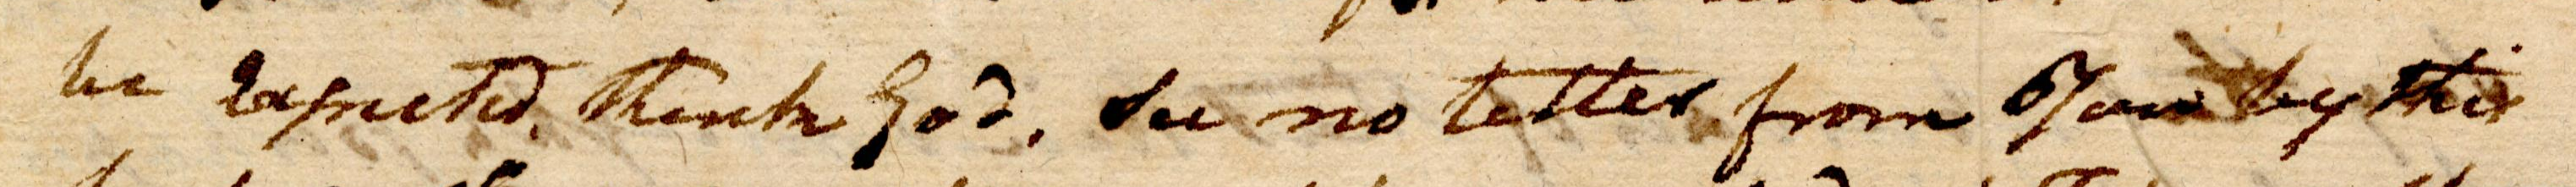be expected thank God, see no letter from You by this
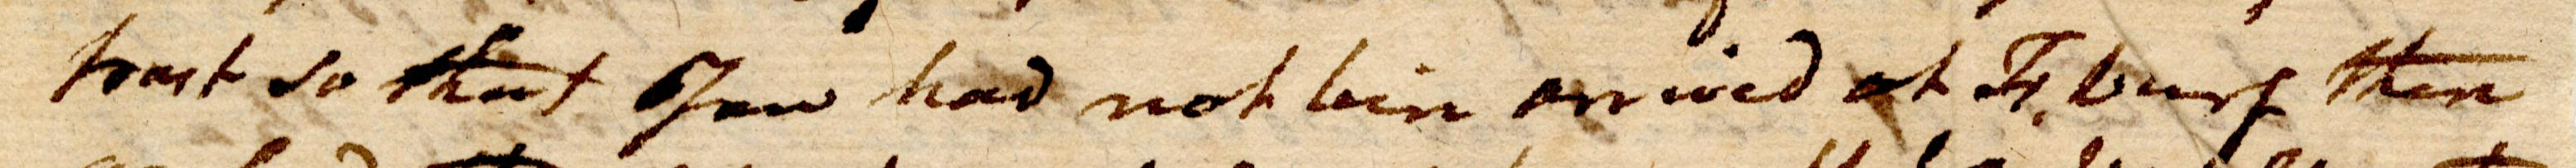post so that you had not bein arrived a Ft burgh there
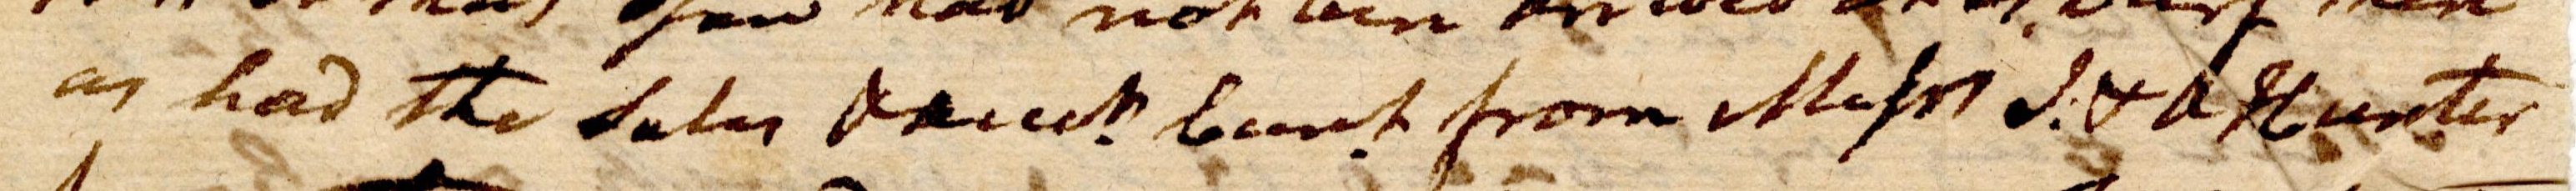as had the sales & acc^t Count from Mess^rs S: & A Hunter
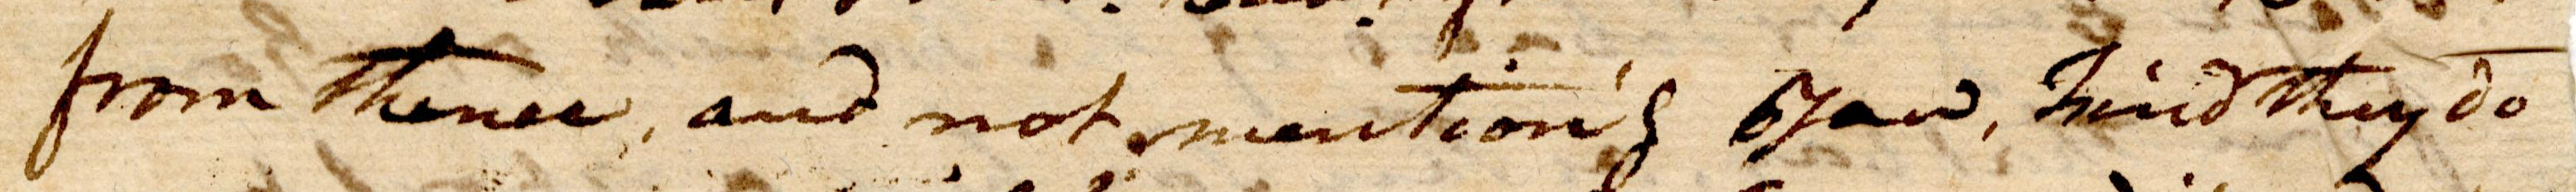from there, and not mention'g you, Find they do
